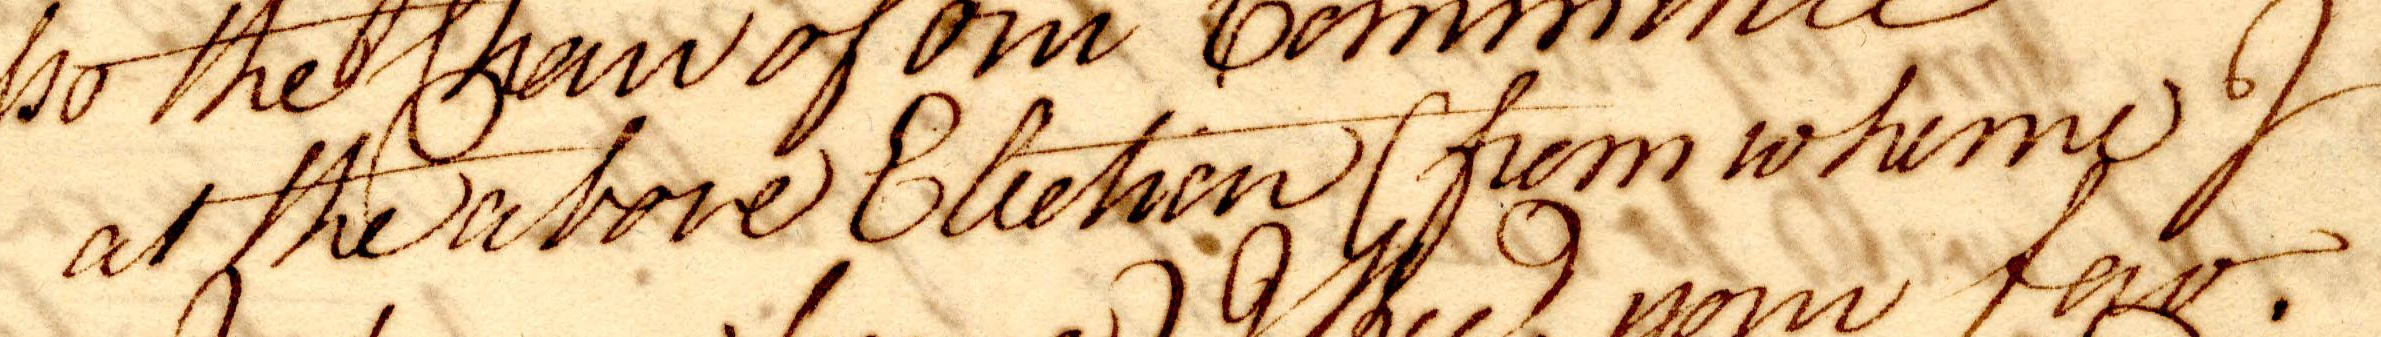At the above Election (from whence I
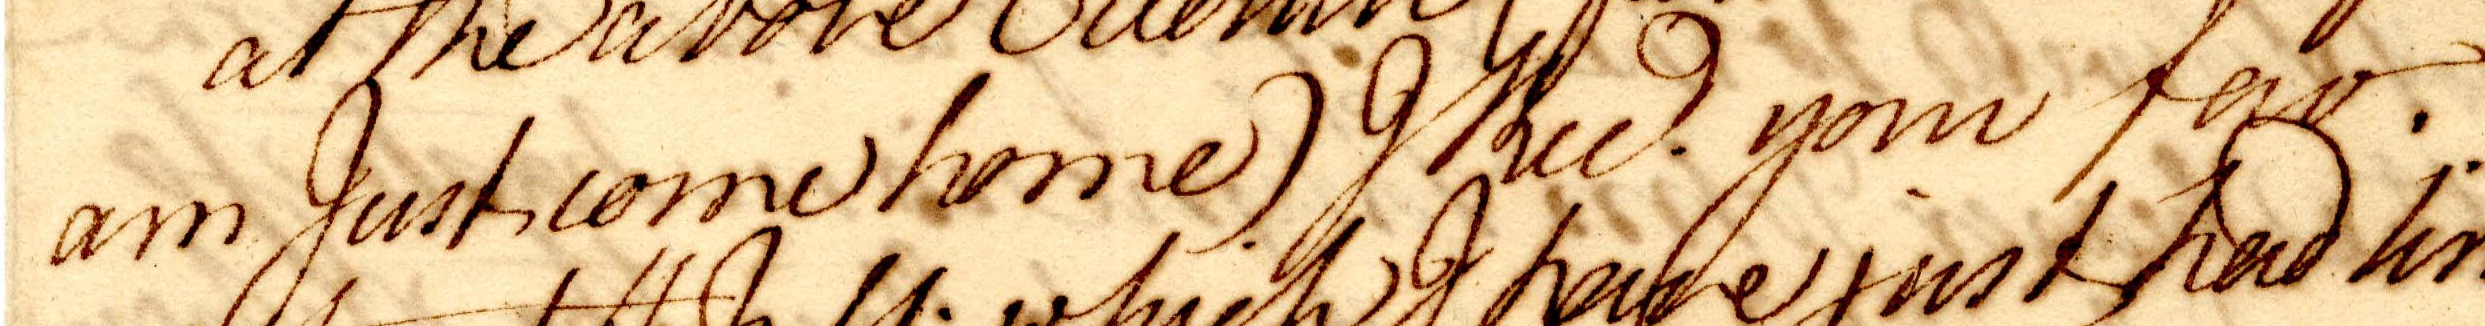am Just come home) I Rec^d. your fav.
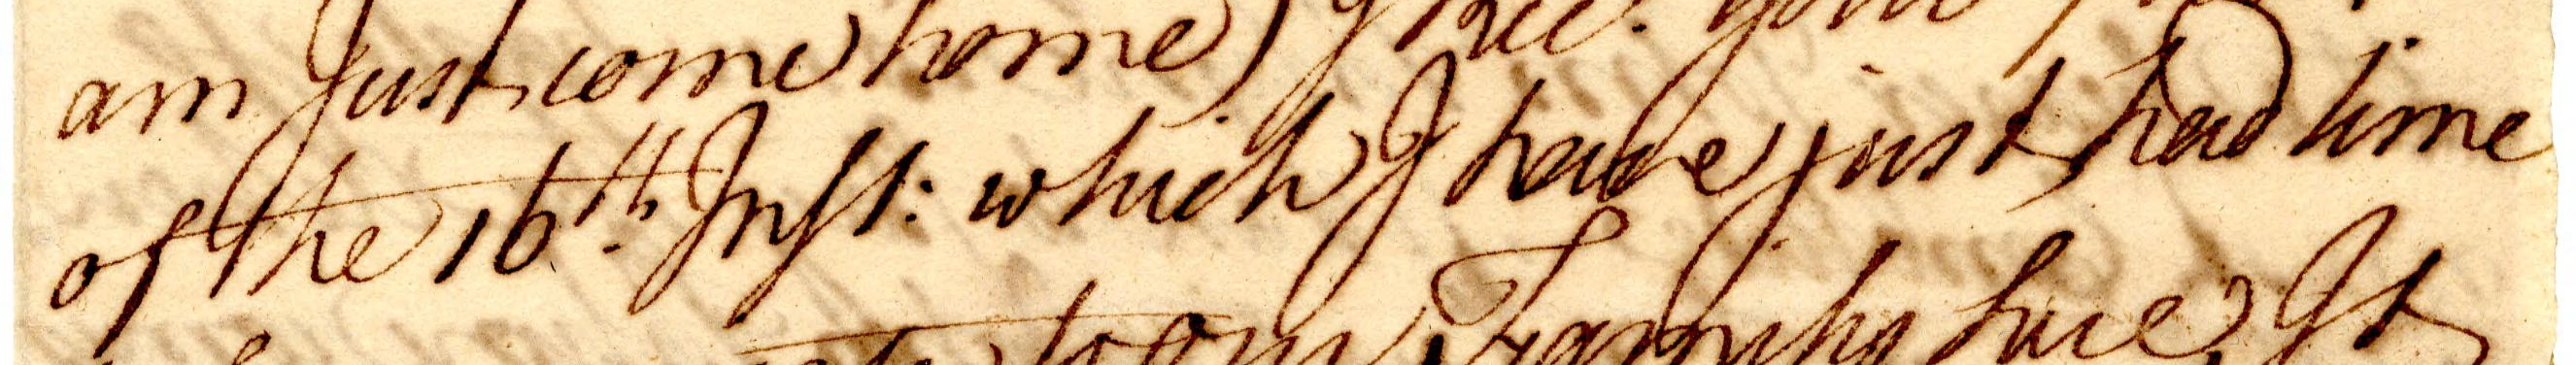of the 16^th. Inst: which I have just had time
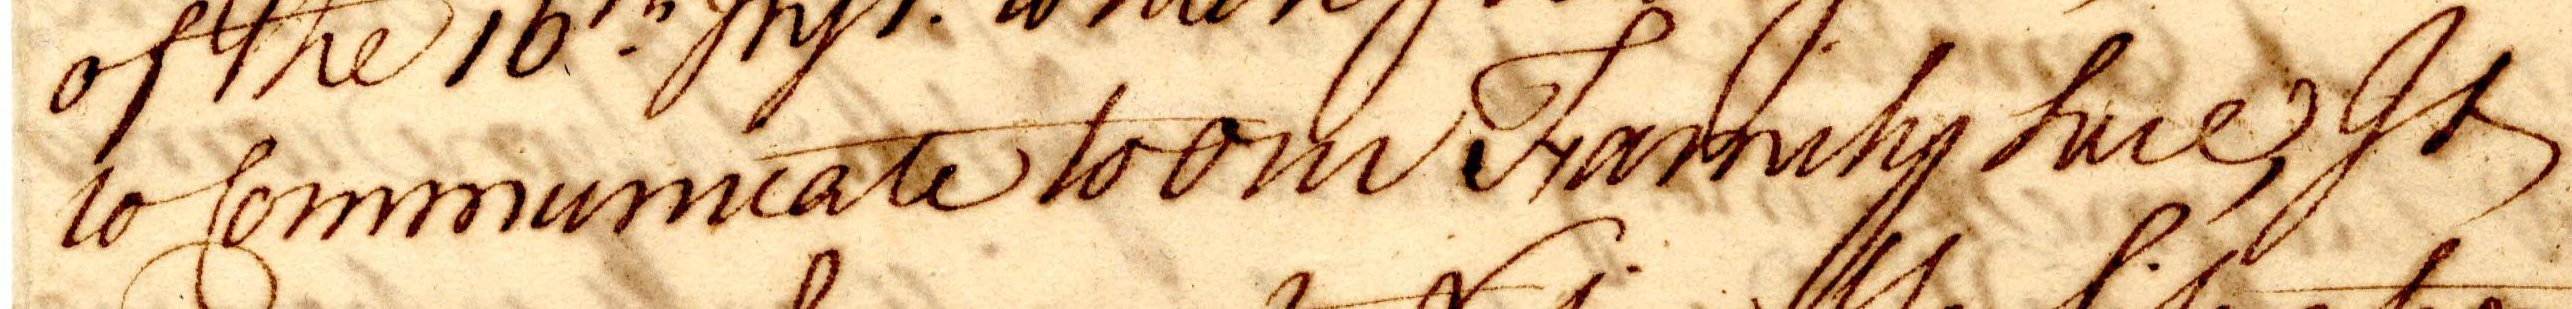to Communicate to our Family sure It
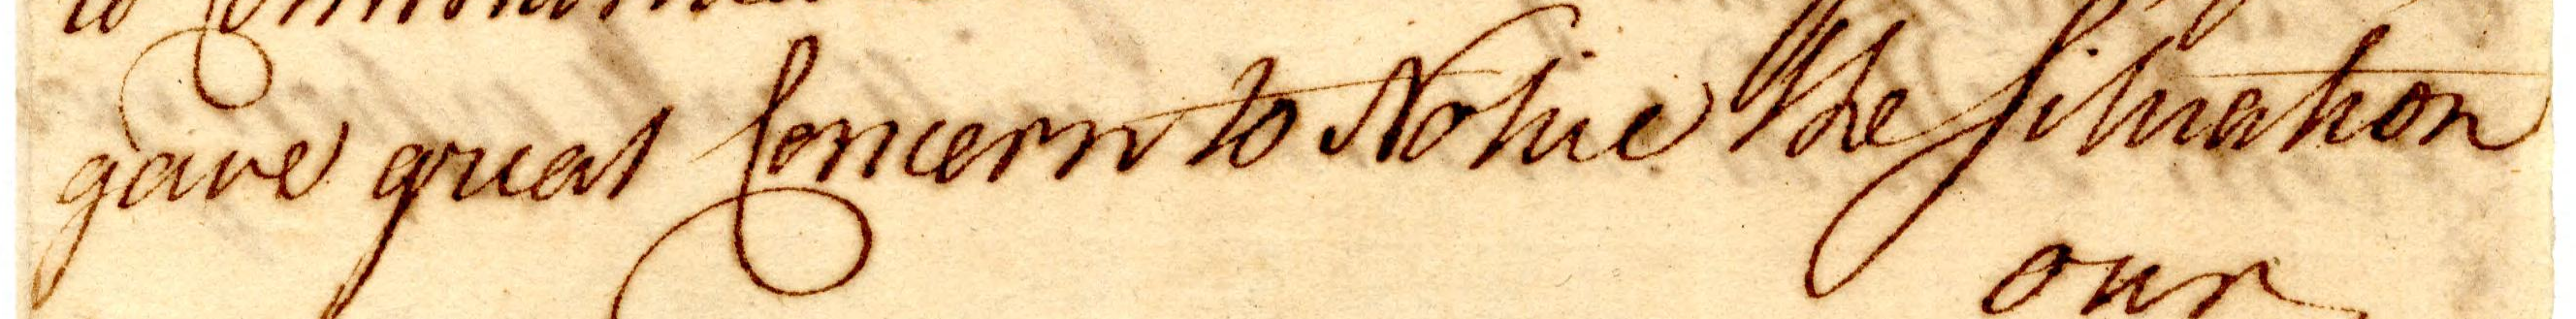gave great Concern to Notice the Situation
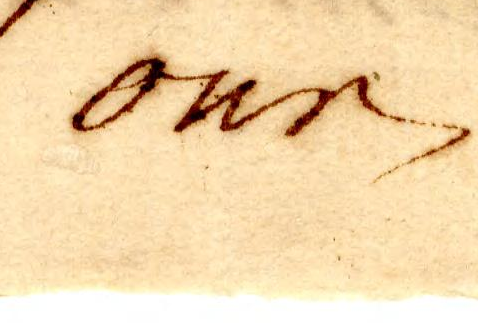our
